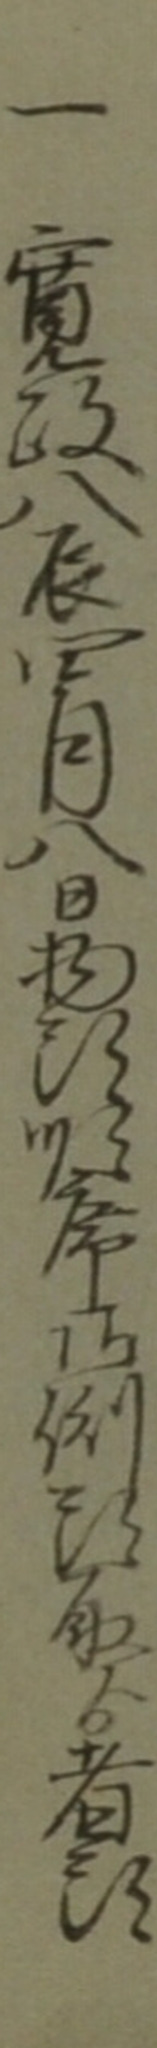一寛政八辰四月八日物頭順席御側頭取ゟ者頭
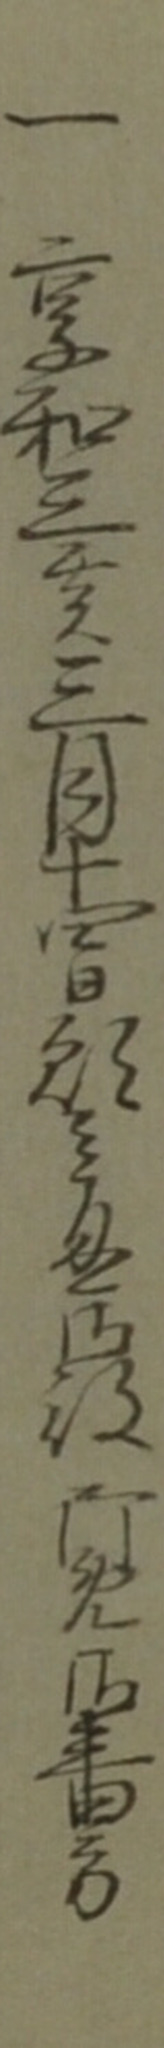一享和三亥三月十四日願之通御役御免御番方
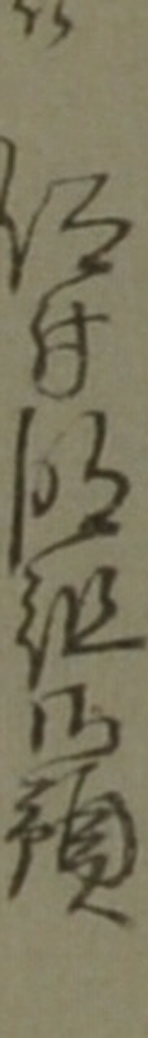被仰付明組御預
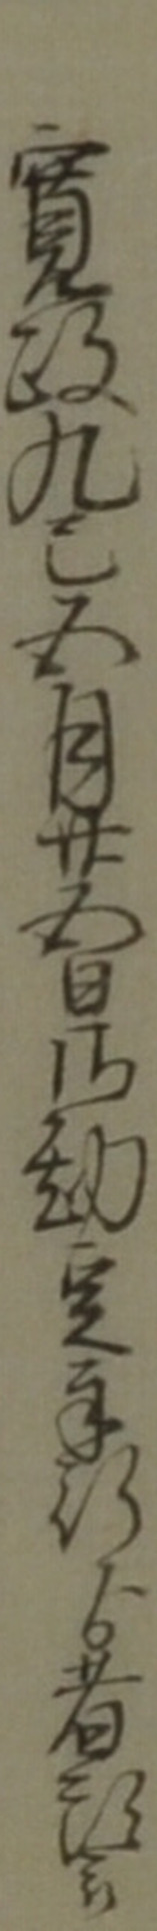一寛政九巳五月廿五日御勘定奉行ゟ者頭被
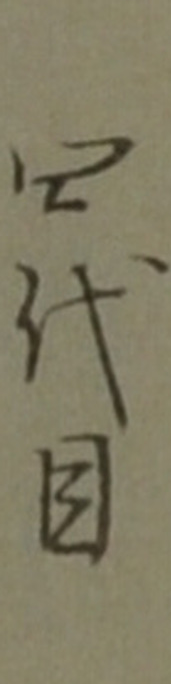四代目
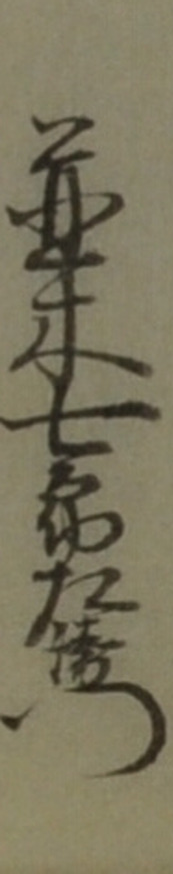並木七郎左衛門
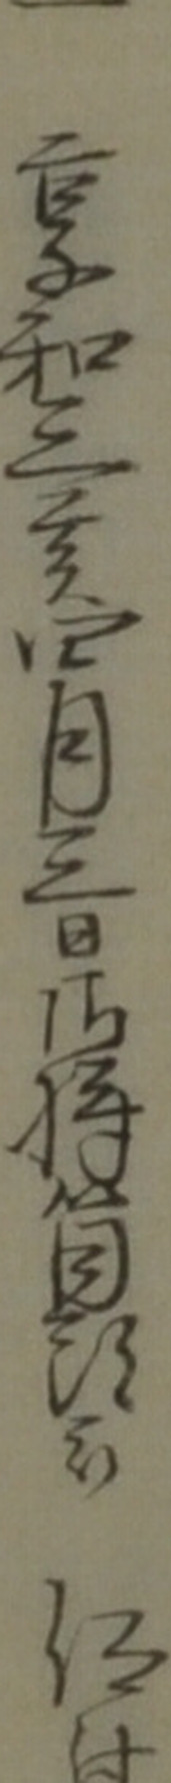一享和三亥四月三日御持筒頭被仰付
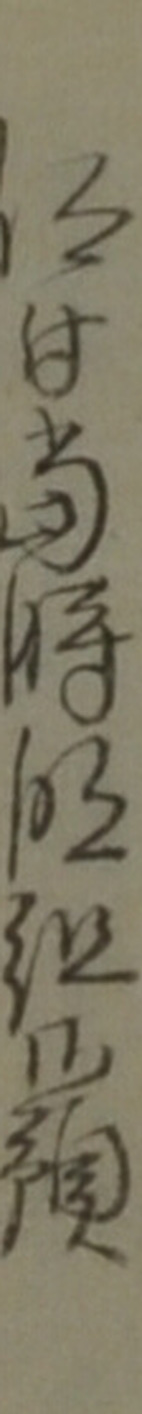仰付当時明組御預
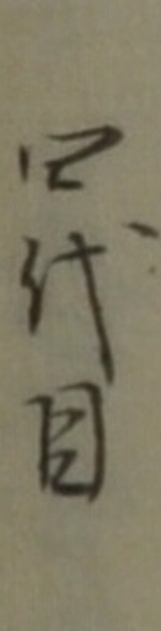四代目
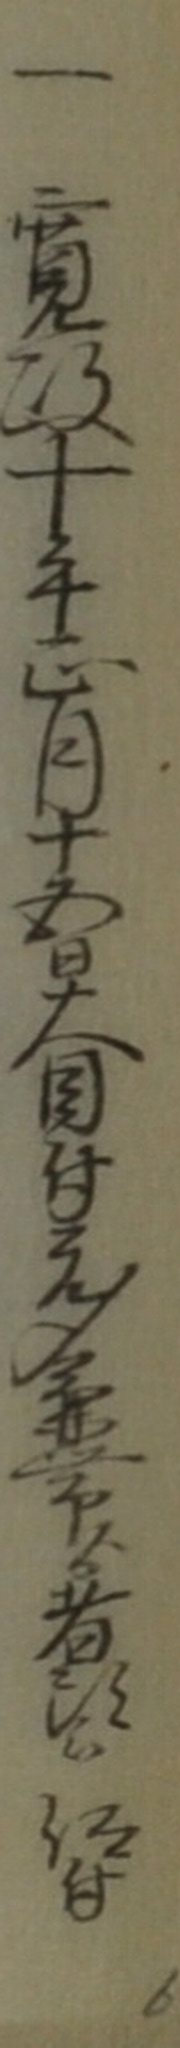一寛政十午正月十五日大目付元〆兼帯ゟ者頭被仰付
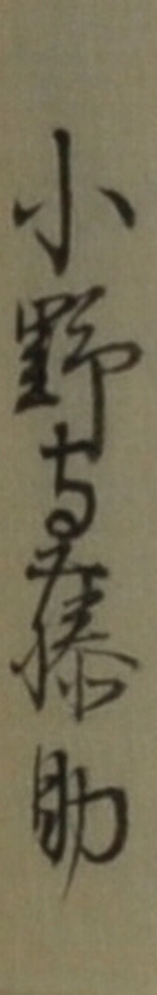小野寺藤助
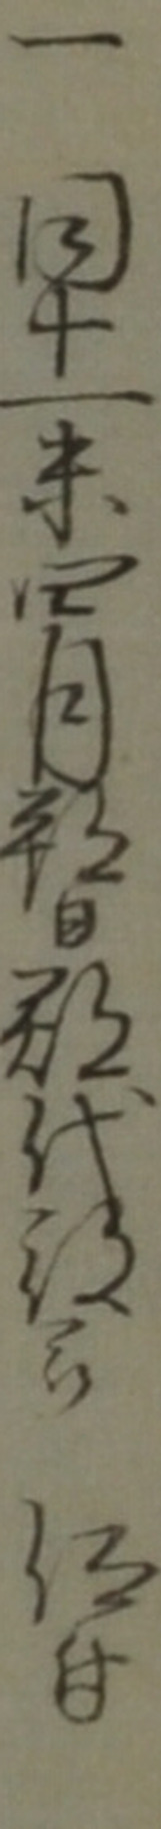一同十一未四月朔日郡代役被仰付
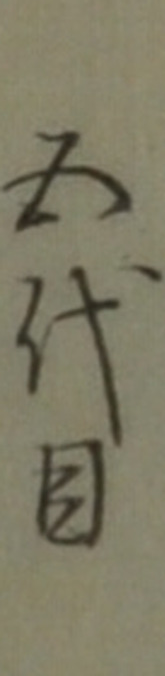五代目
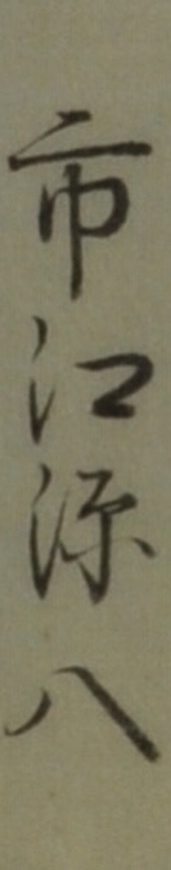市江源八
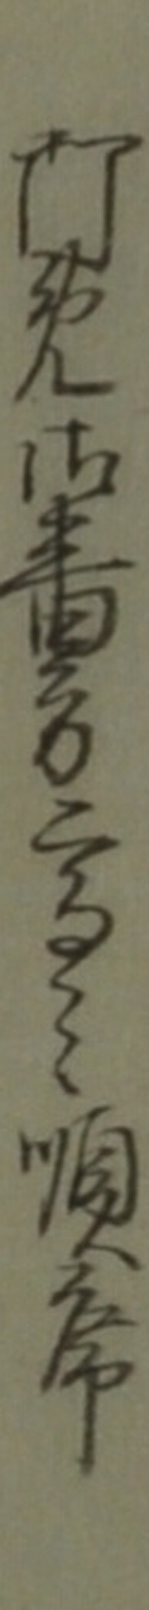御免御番方高之順席
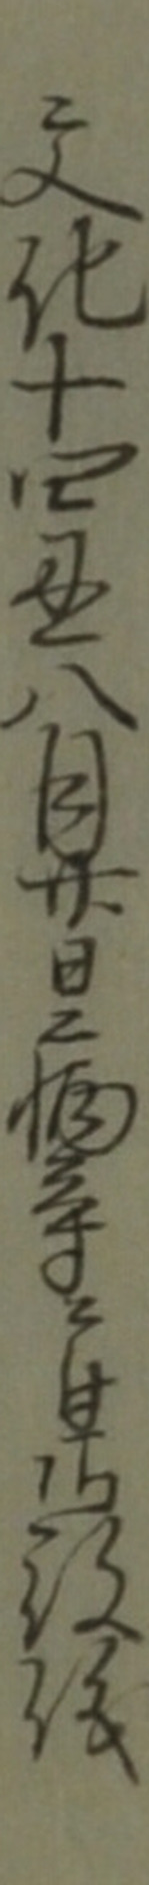一文化十四丑八月廿日病気ニ付御役儀
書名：諸御役代々録（二）
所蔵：伊那市立高遠町図書館・合同会社AMANE
